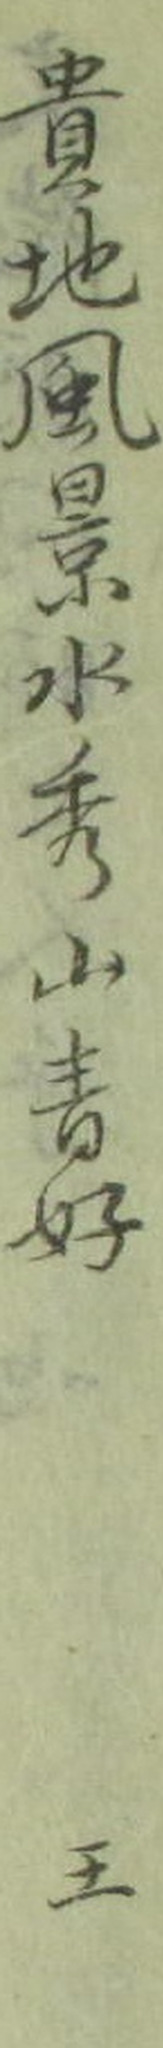貴地風景水秀山青好王
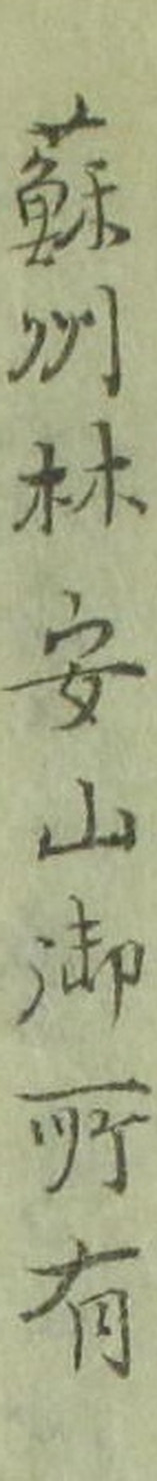蘇州林安山御所有王
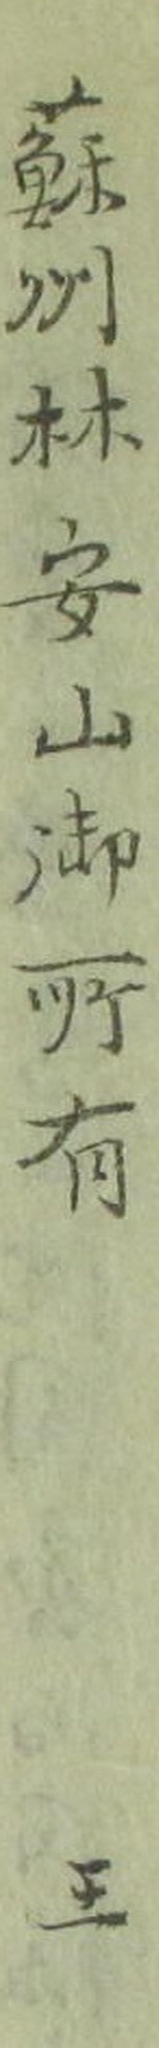蘇州林安山御所有王
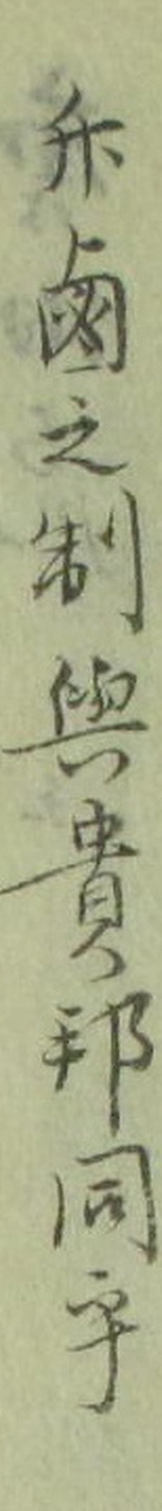升鹵之制與貴邦同乎鳴
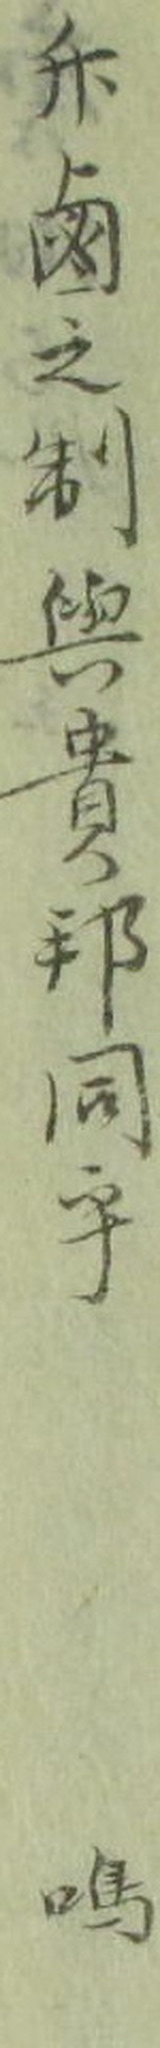升鹵之制與貴邦同乎鳴
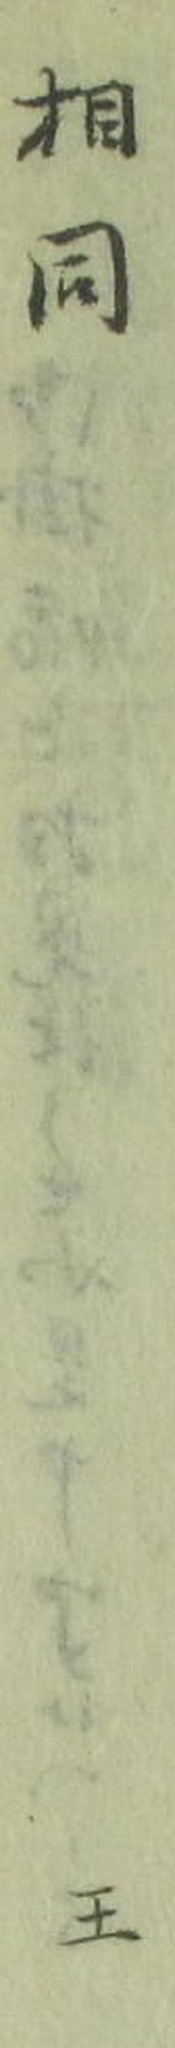相同王
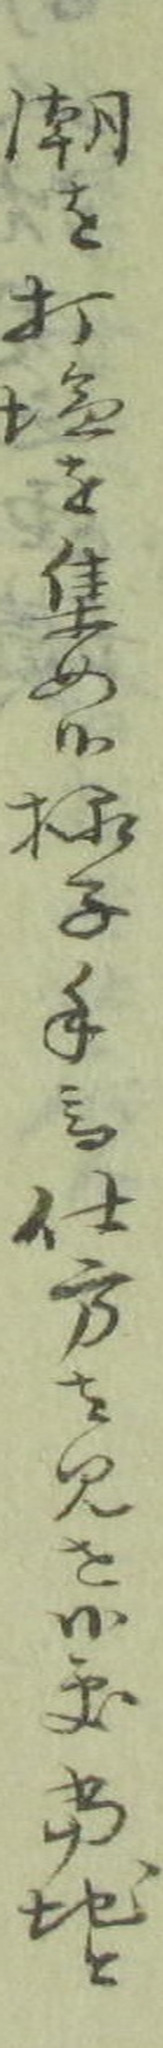潮を打塩を集め候様子手に而仕方を見せ候処当地と
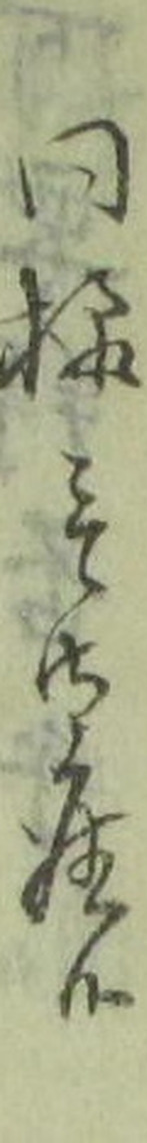同様にて御座候
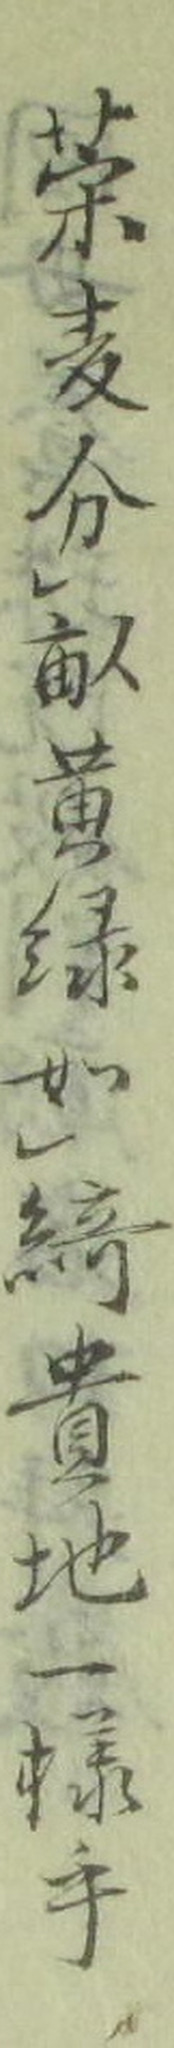麦分畝黄緑如綺貴地一様乎鳴
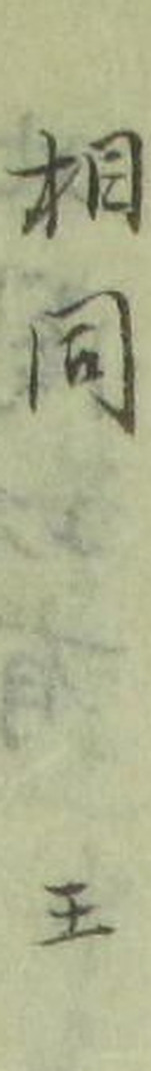相同王
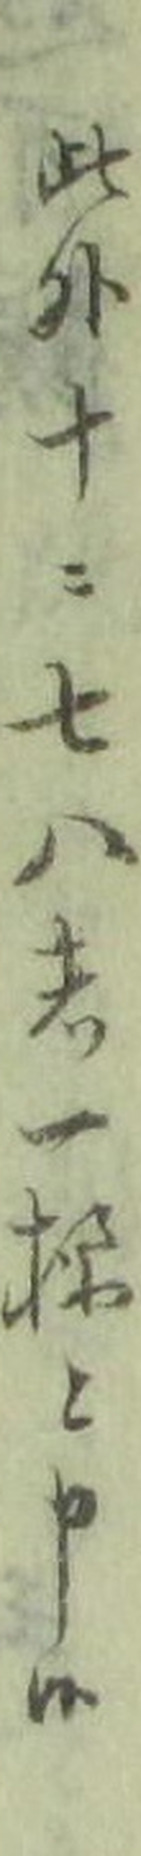此外十に七八者一様と申候
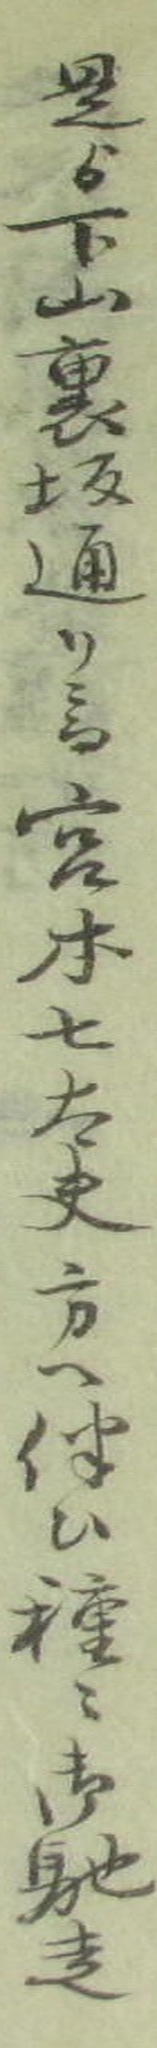是ゟ下山裏坂通りに而宮本七太夫方へ伴ひ種々御馳走
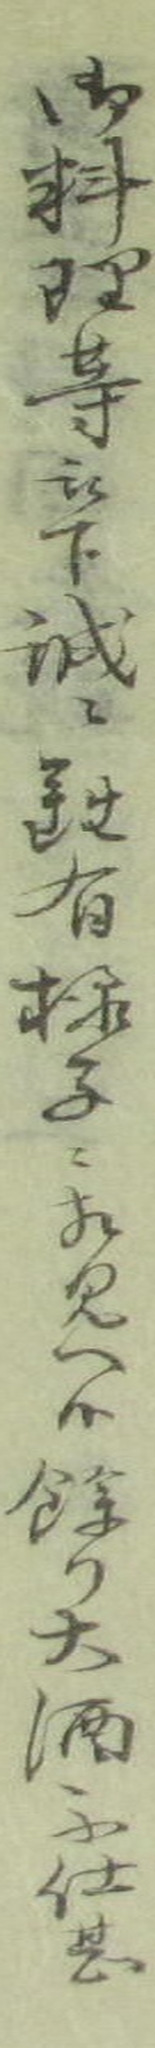御料理等被下誠に難有様子に相見へ候餘り大酒不仕甚
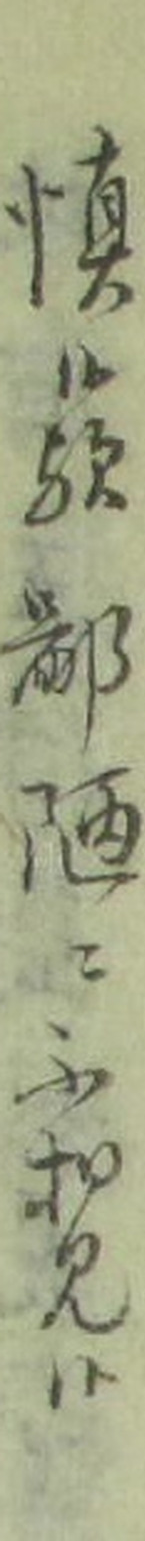慎候歟鄙陋に不相見候
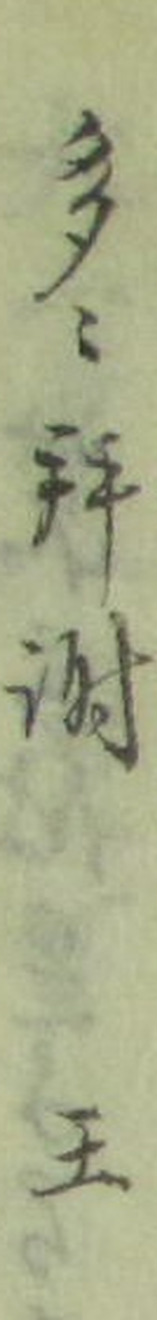多々拝謝王

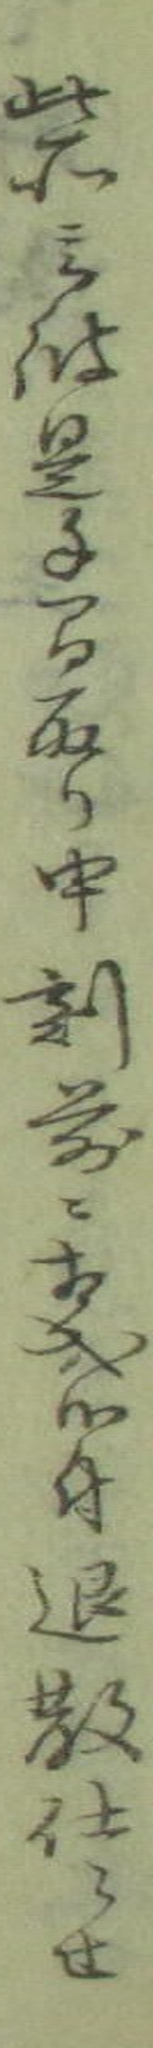此所に而彼是手間取り申刻前に相成候付退散仕らせ
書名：紀州九木浦庄屋記録 四
